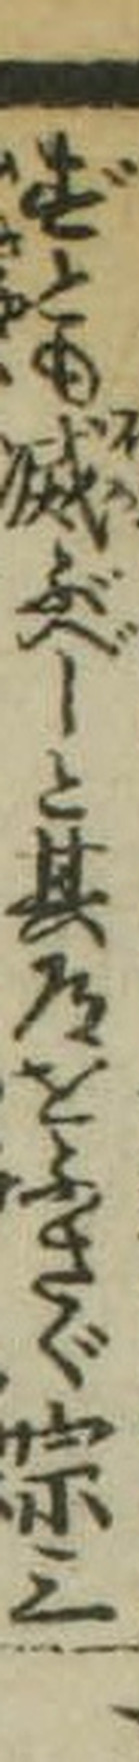ずとも滅ぶべしと其道をふさぐ宗三
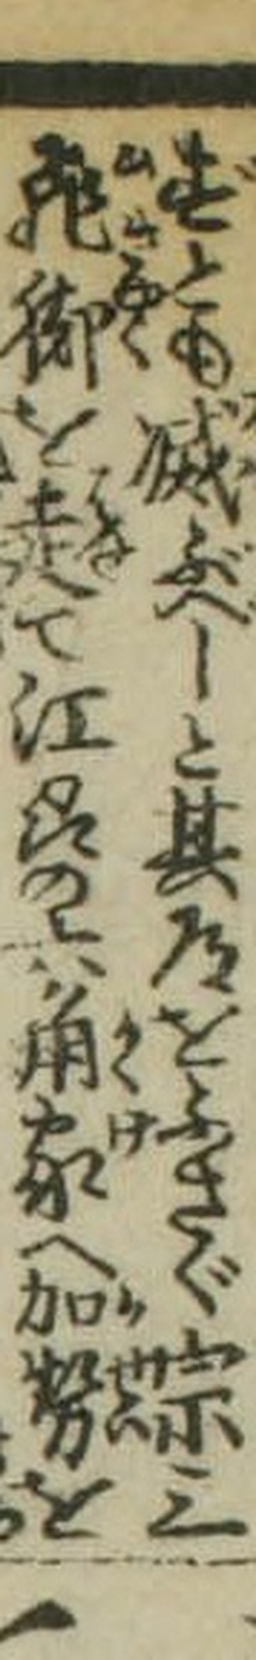飛脚を走て江州の六角家へ加勢を
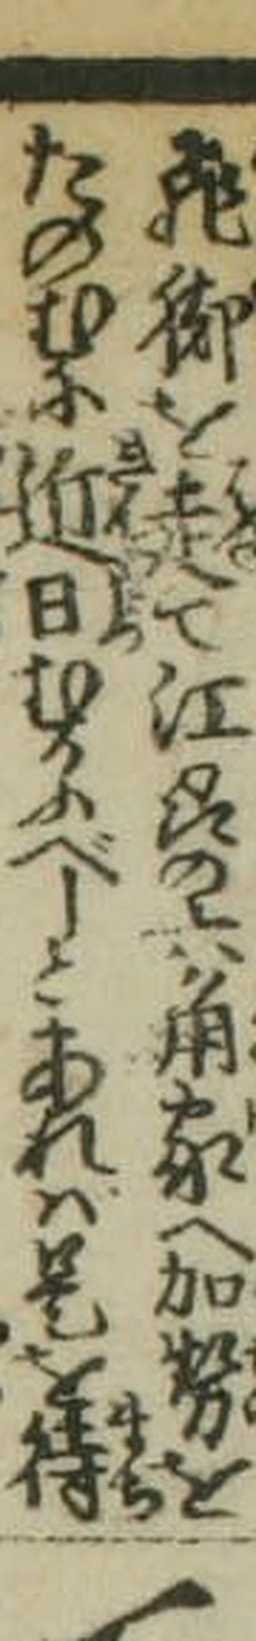たのむに近日むかふべしとあれば是を待
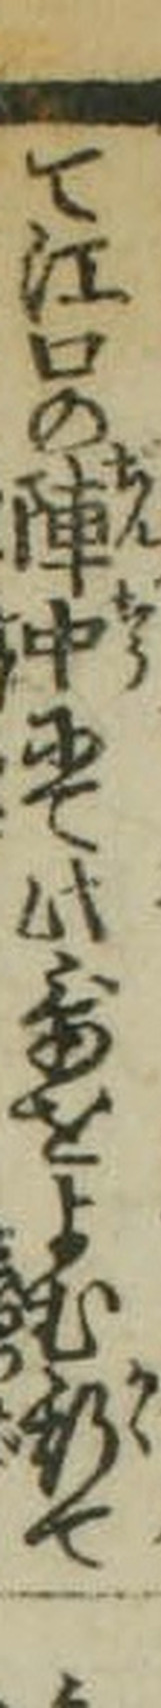て江口の陣中にて此歌をよむ斯て
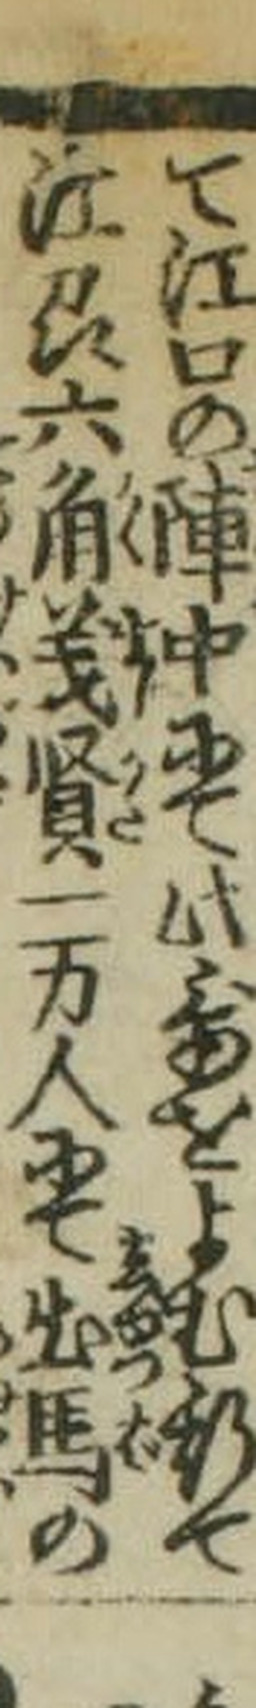江州六角義賢二万人にて出馬の
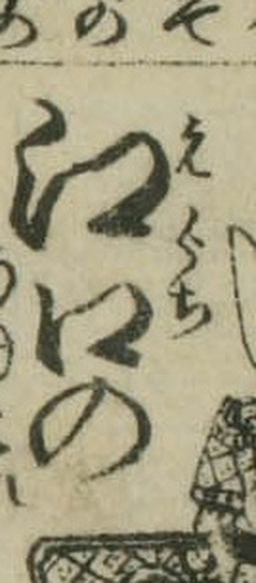江口の
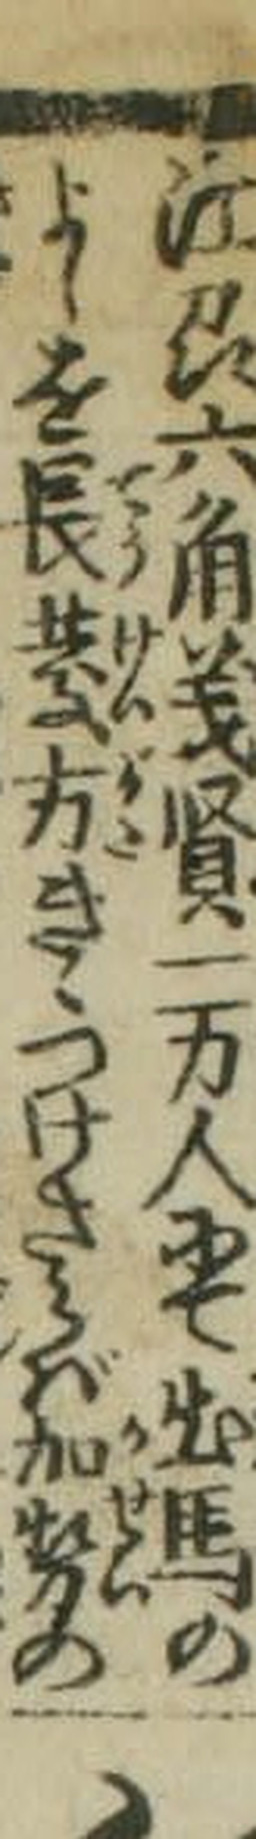よしを長慶方きゝつけさらば加勢の
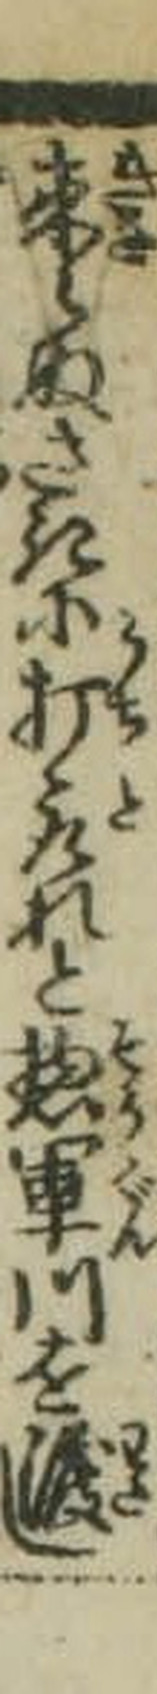来らぬさきに打取れと惣軍川を渡し
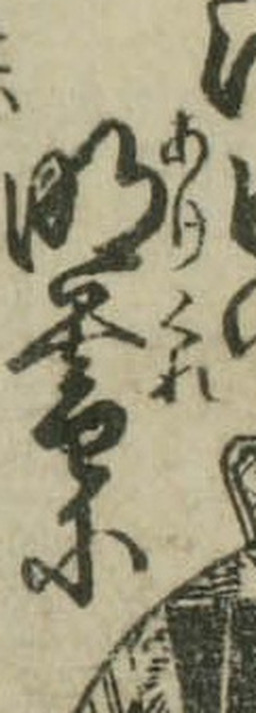明暮に
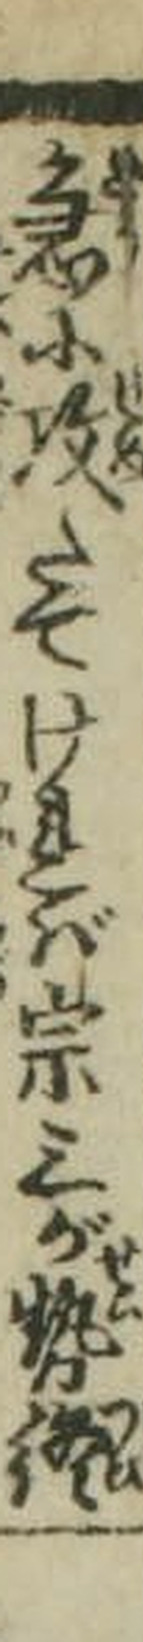急に攻たてければ宗三が勢終
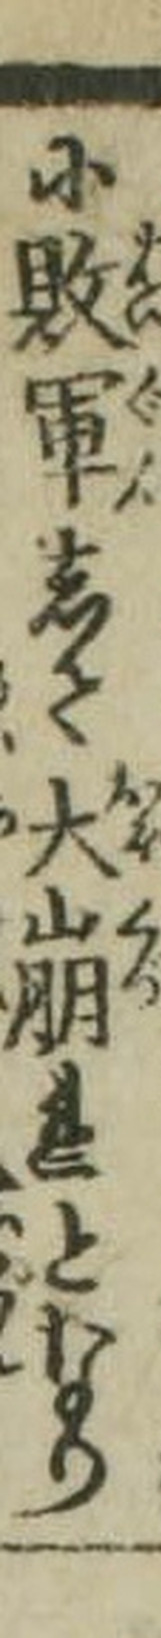に敗軍して大崩れとなり
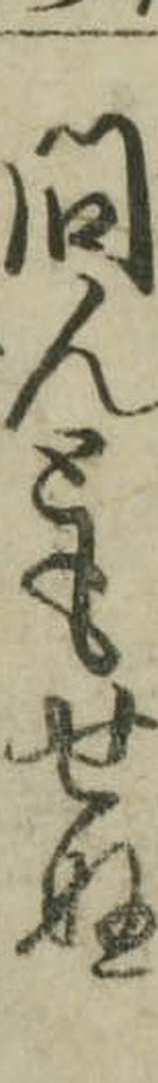問んともせぬ
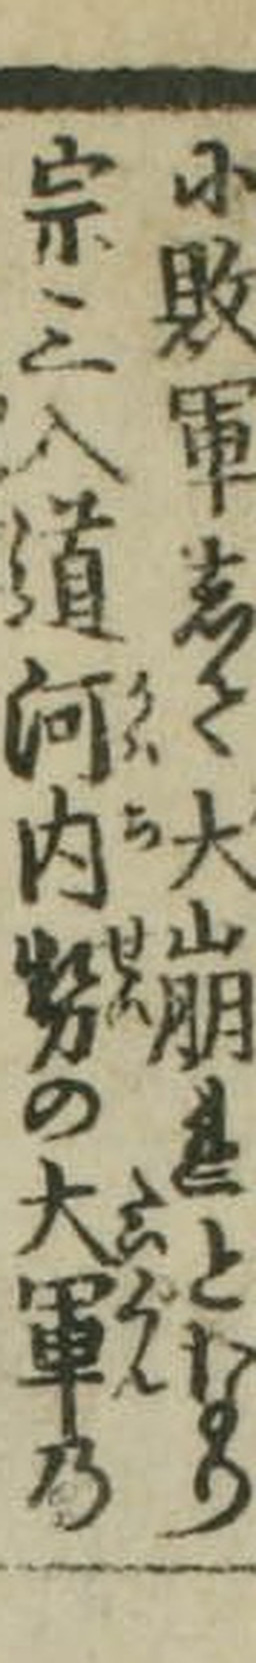宗三入道河内勢の大軍の
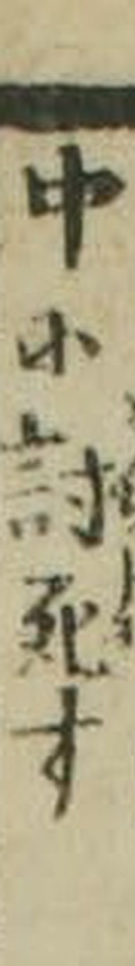中に討死す
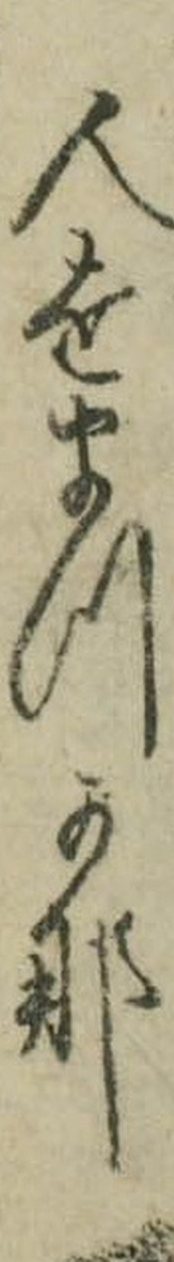人をまつかな
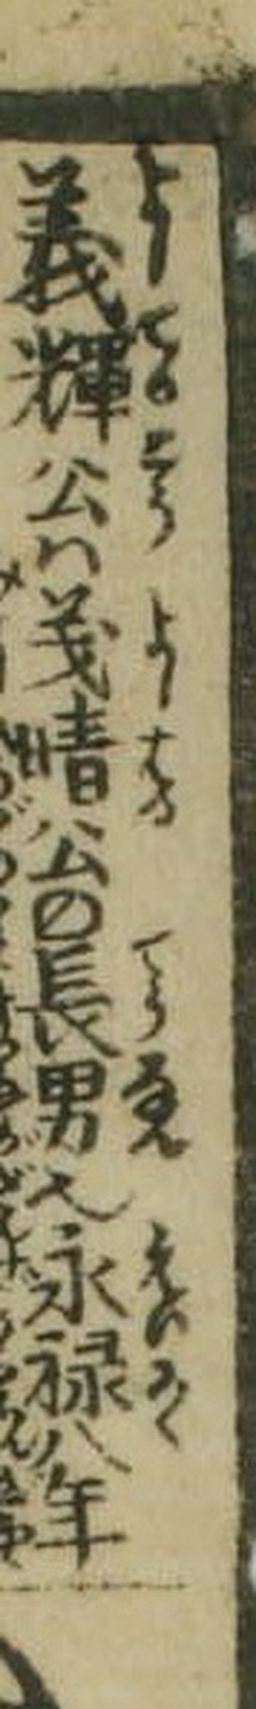義輝公は義晴公の長男也永禄八年
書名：續英雄百人一首
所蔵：東京学芸大学附属図書館
